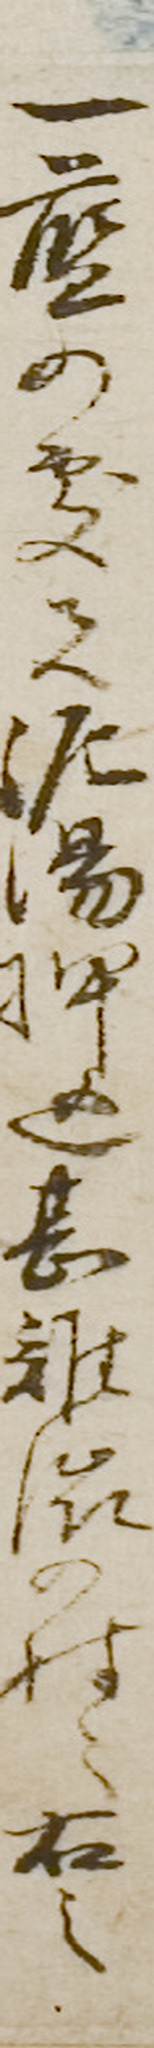一藍の処者泥湯押込甚難渋の村々右之
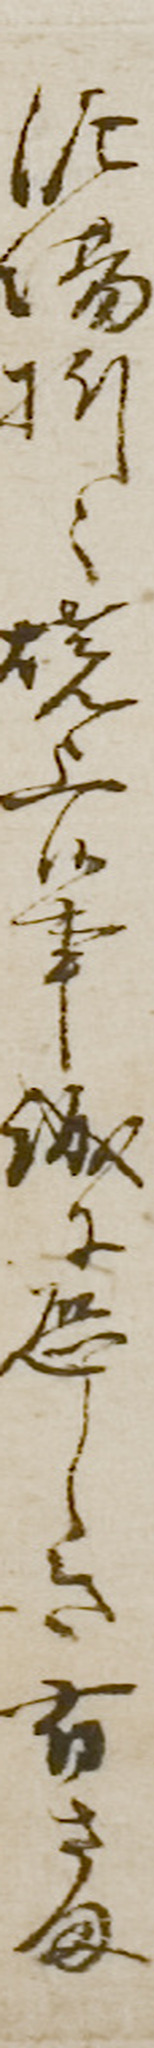泥場折々焼上候事誠に恐しき有様
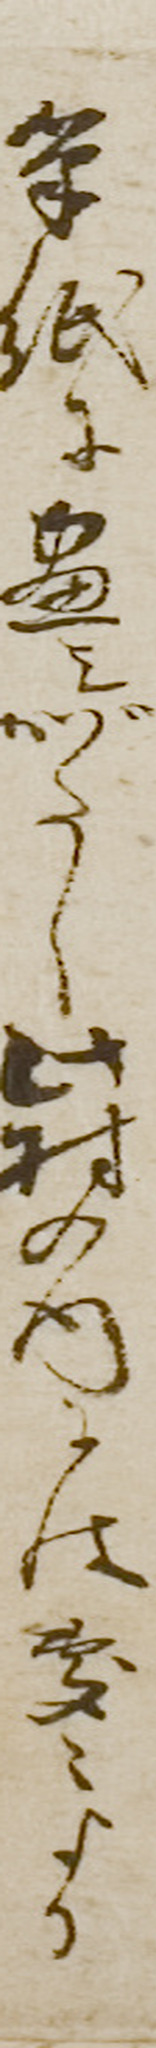筆紙に盡しがたし此村の内には処々より
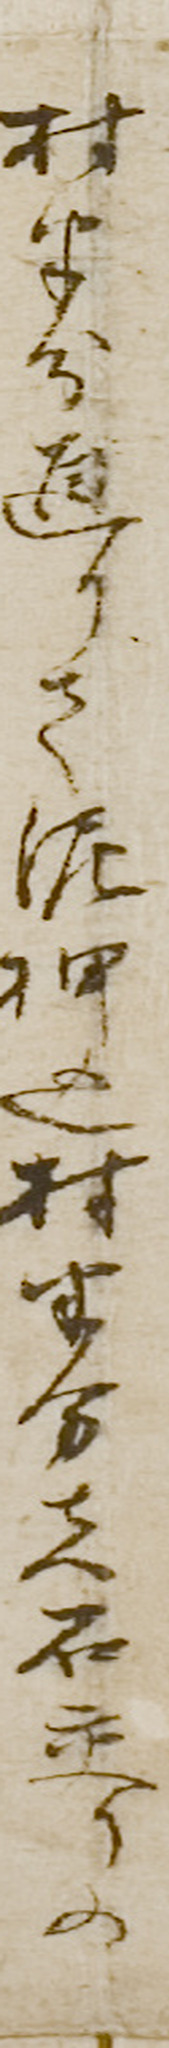村半分通りて泥押込村半分者石交りの
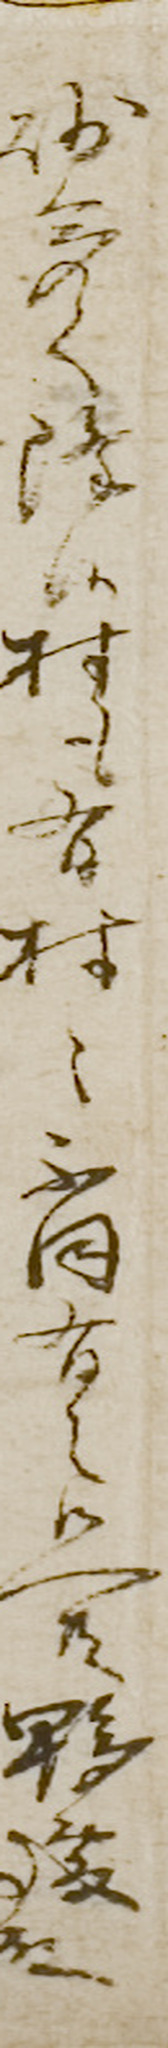砂多く障候村も有村々不同有之候へ共夥敷事故
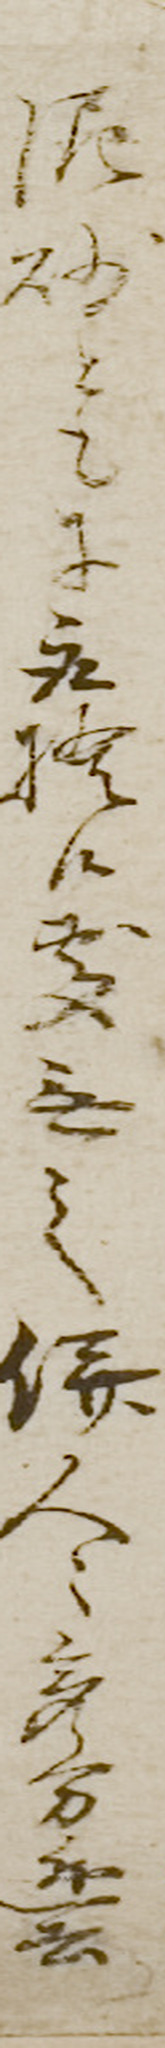泥砂ともに取控候所無之併人々多分逃去
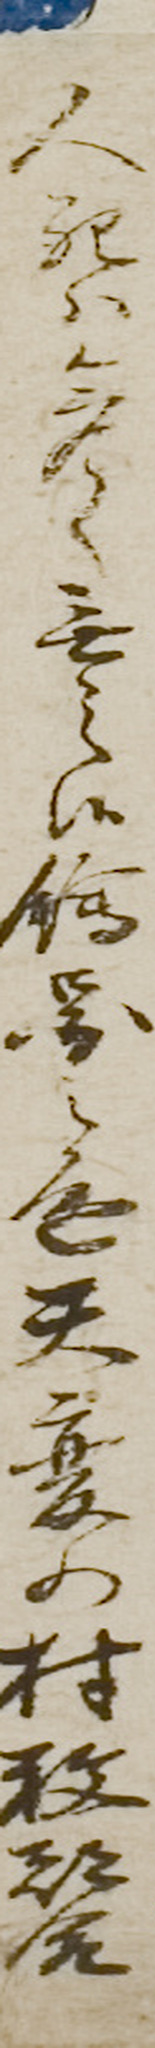人死ハ多く無之候絵図之通天変の村数都合
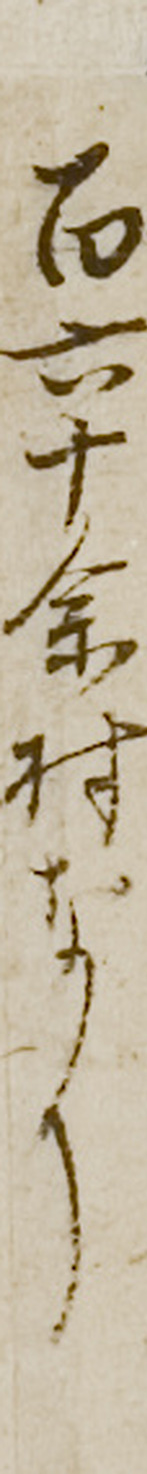百六十余村なり
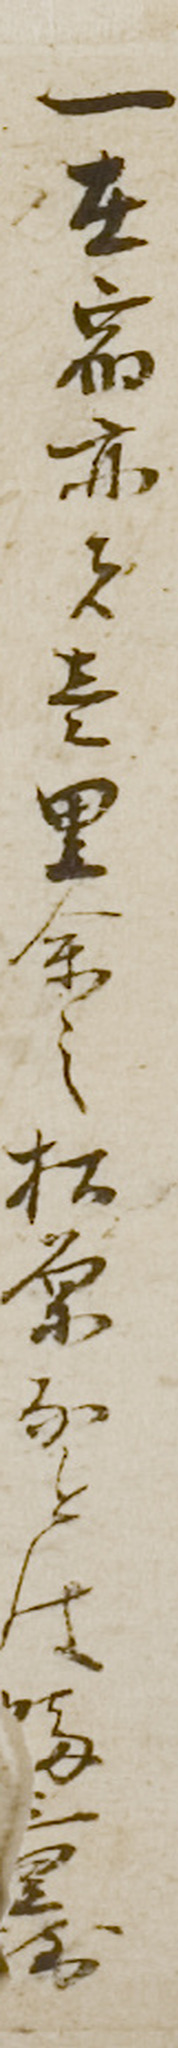一在宿亦者壱里余之松原なとは幅三里程
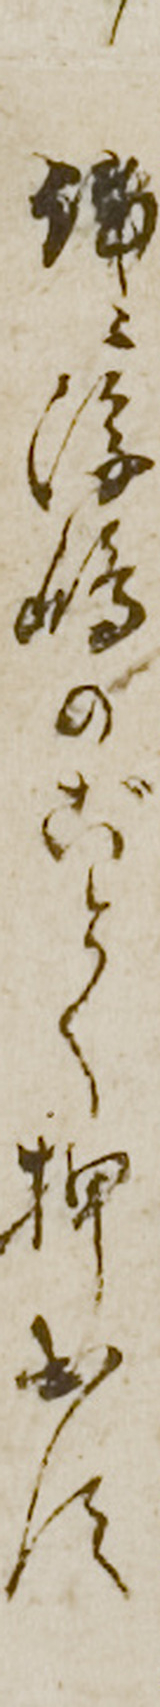端々浮嶋のごとく押出す
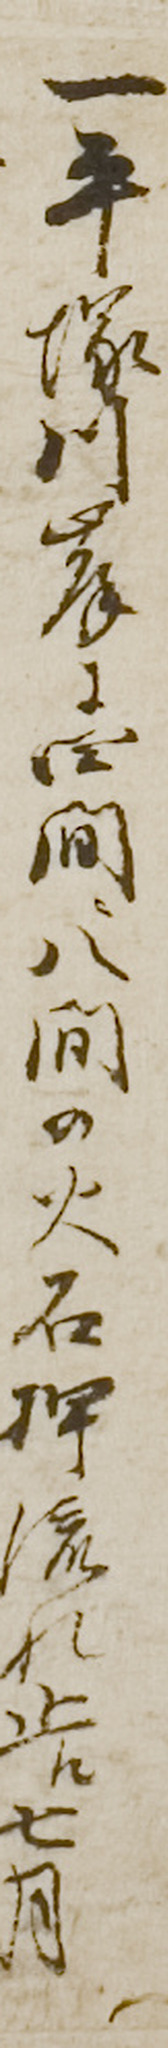一平塚川岸に四間八間の火石押流れ止ㇽ七月
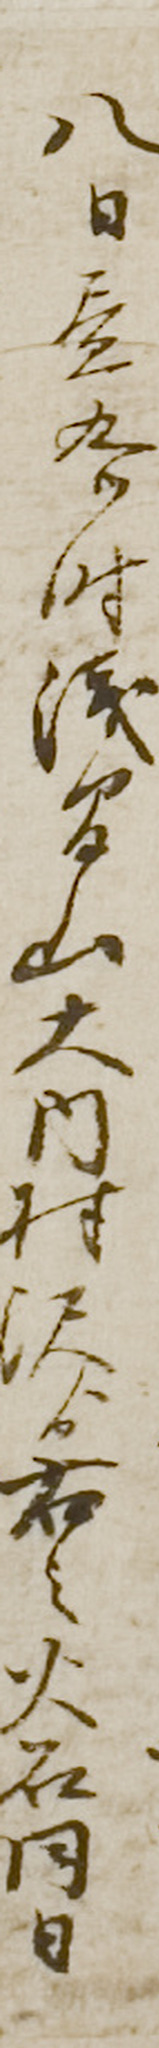八日昼九ッ時浅間山大内村沢ゟ右之火石同日
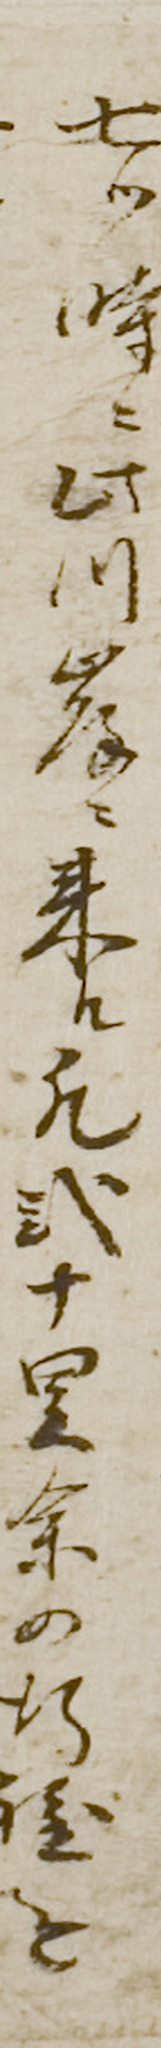七ッ時弐此川岸に来る凡弐十里余の行程を
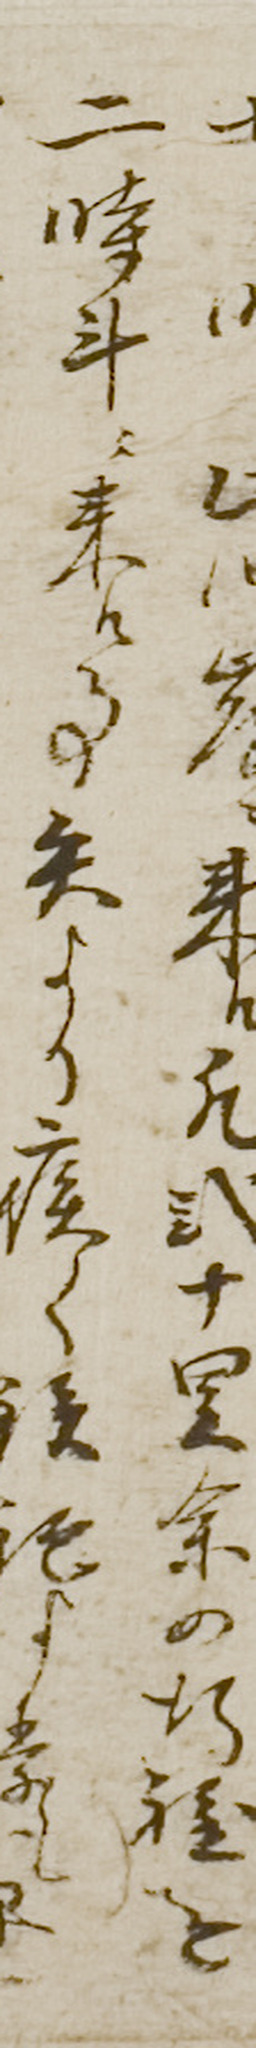二時斗二来ㇽ事矢より疾く鉄炮よりも早し
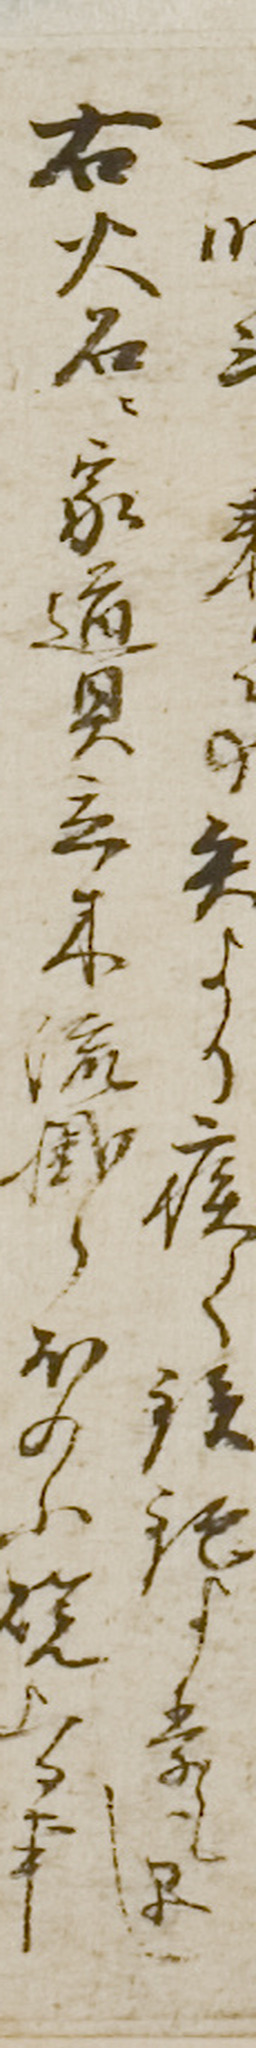右火石二家道具立木流掛りほのふ焼上る事
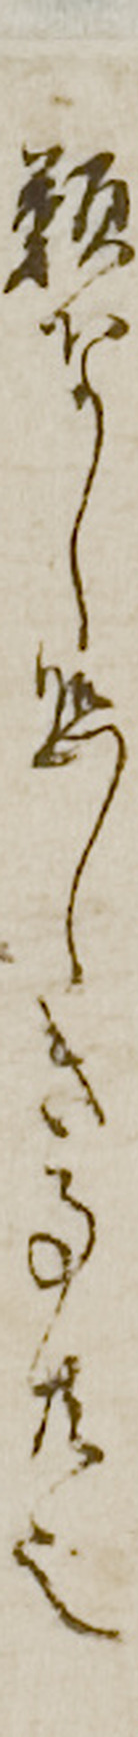類なし恐しき事共也
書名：[天明三年浅間山噴火]
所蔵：東京大学総合図書館 General Library in the University of Tokyo, JAPAN
